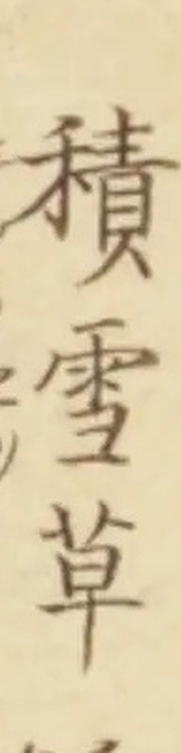積雪草
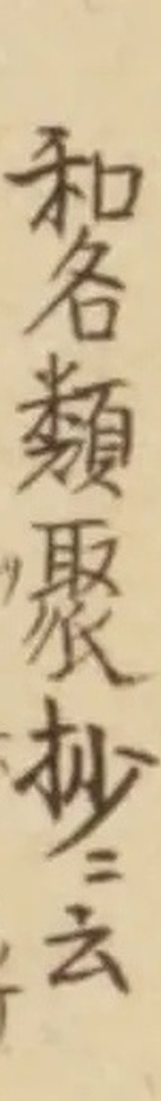和名類聚抄に云
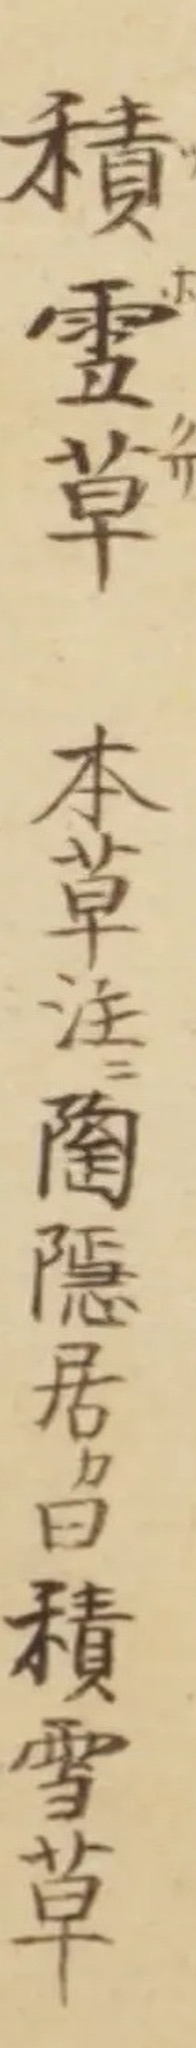積雪草本草注ニ陶隠居カ曰積雪草
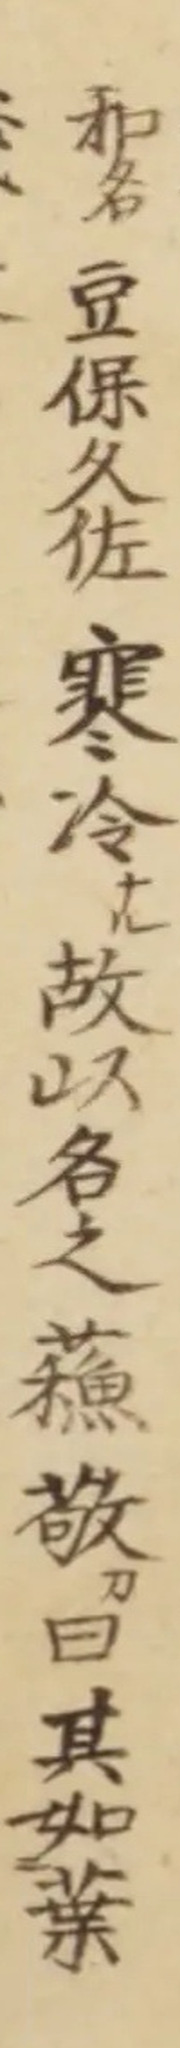和名豆保久佐寒冷ナル故以名之蘓径敬カ曰其如葉

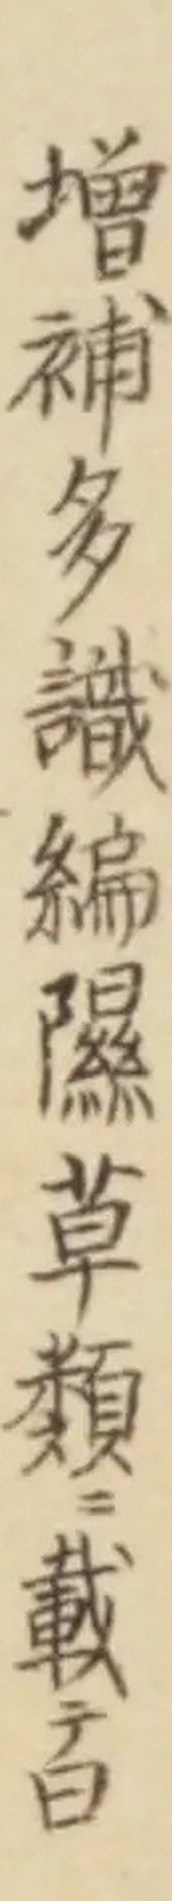増補多識隰草類載曰
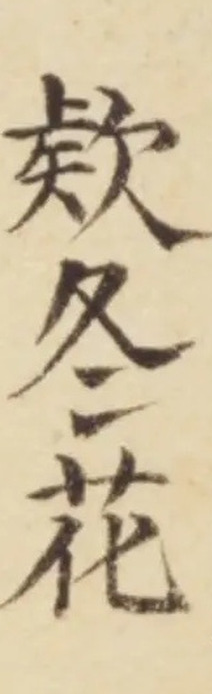欵冬花
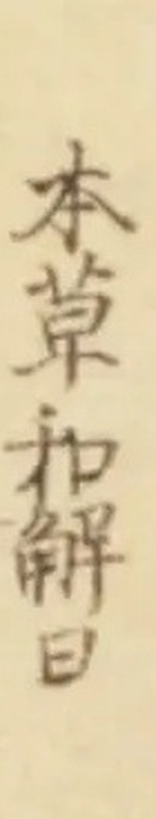本草和解曰
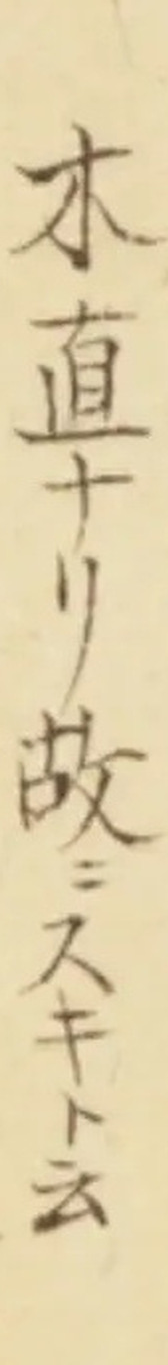木直ナリ故スキト云
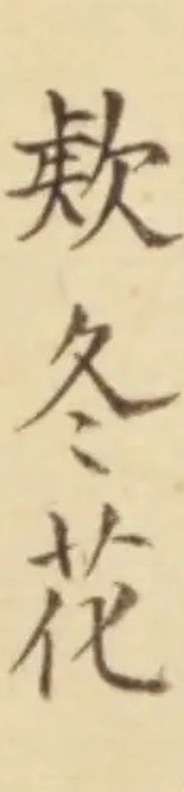欵冬花
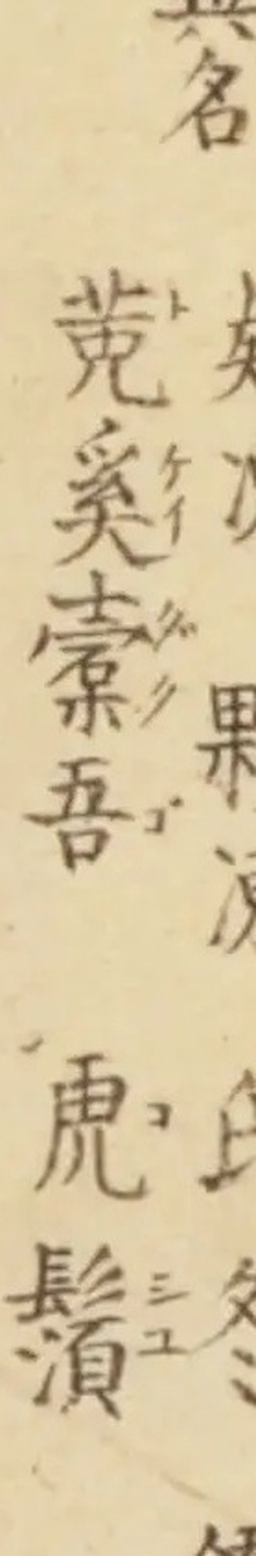莵奚槖吾虎鬚
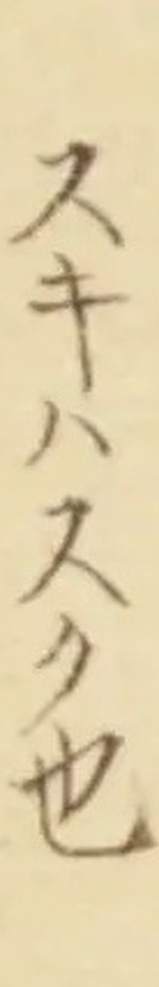スキハスク也
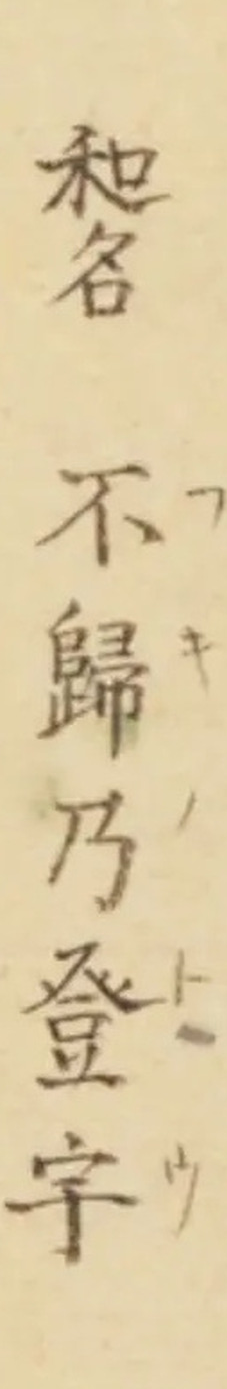和名不帰乃登宇
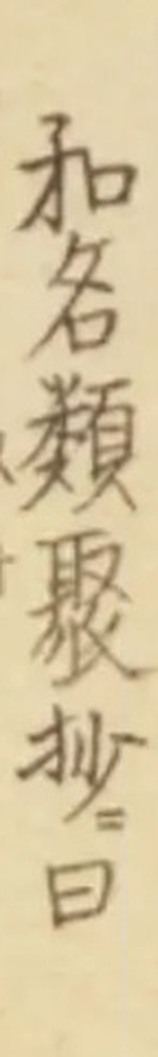和名類聚抄曰
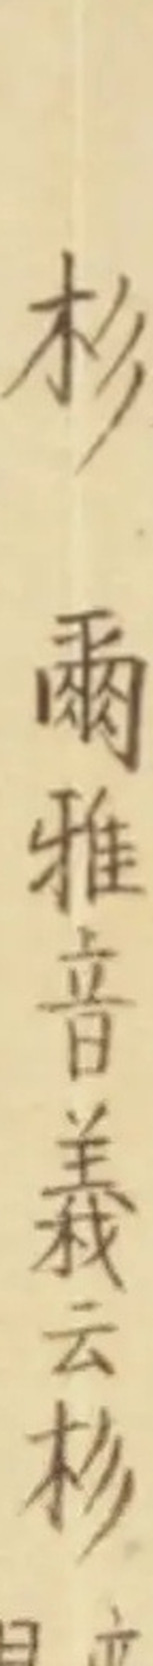杉爾雅音義云杉
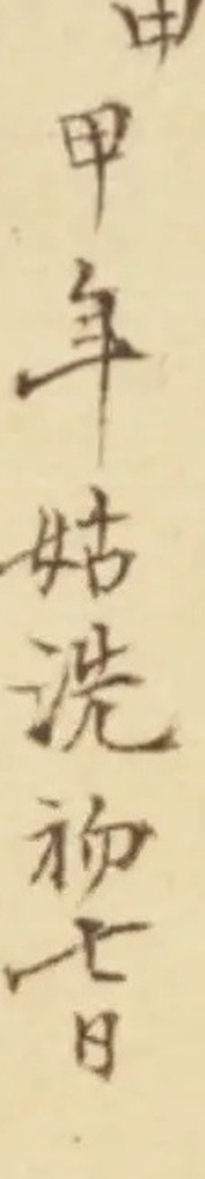甲申年姑洗初七日
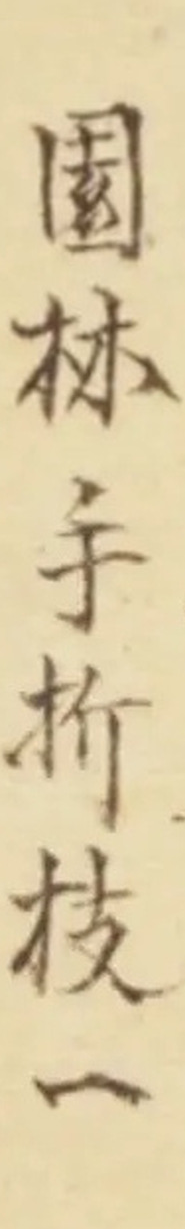園林手折枝一
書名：梅園草木花譜春之部. 1
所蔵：国立国会図書館 National Diet Library, JAPAN
